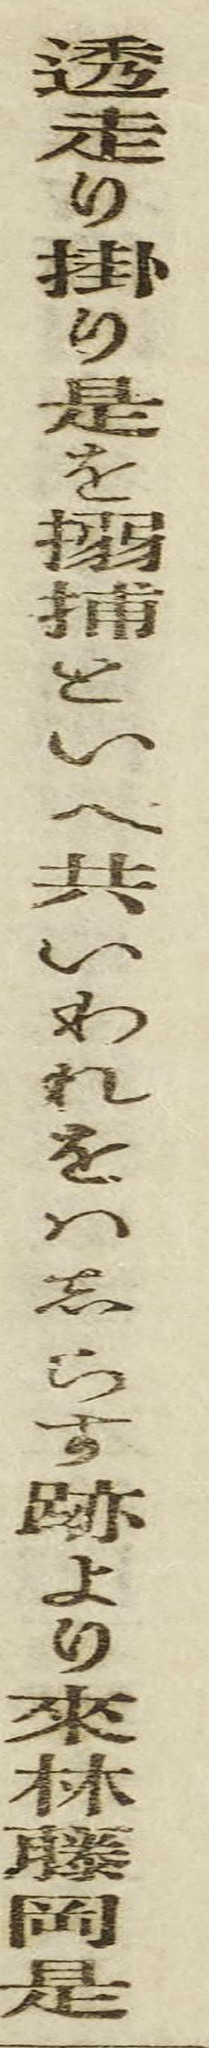透走り掛り是を搦捕といへ共いわれをはしらす跡より来林藤岡是
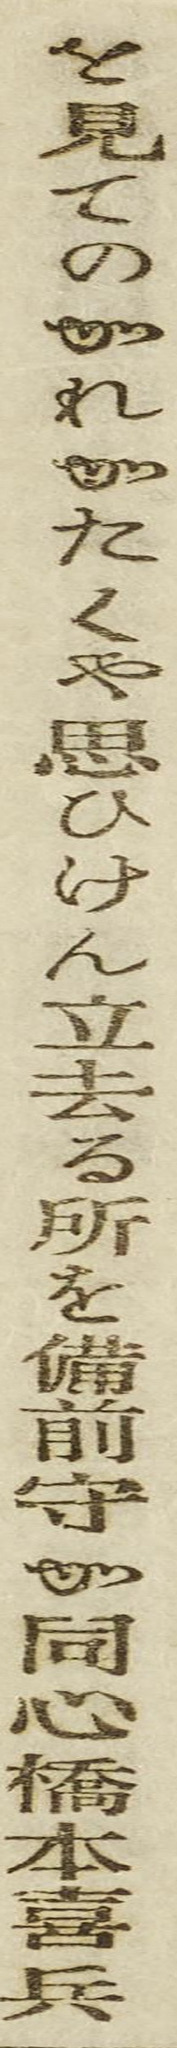を見てのかれかたくや思ひけん立去る所を備前守か同心橋本喜兵
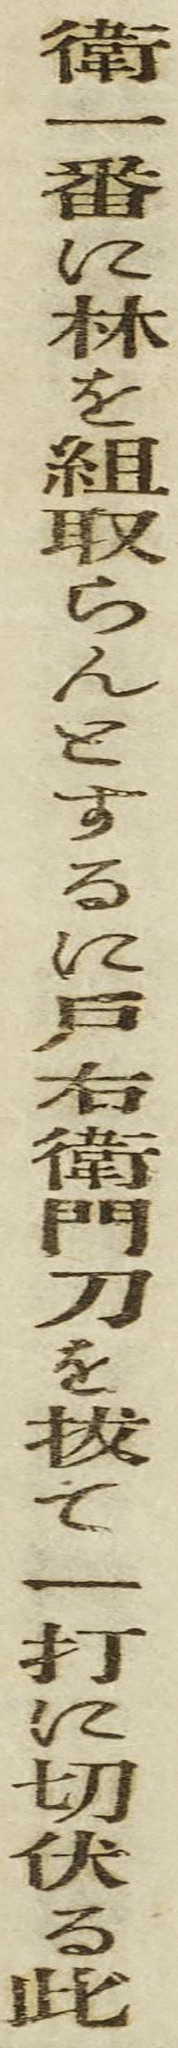衛一番に林を組取らんとするに戸右衛門刀を抜て一打に切伏る此

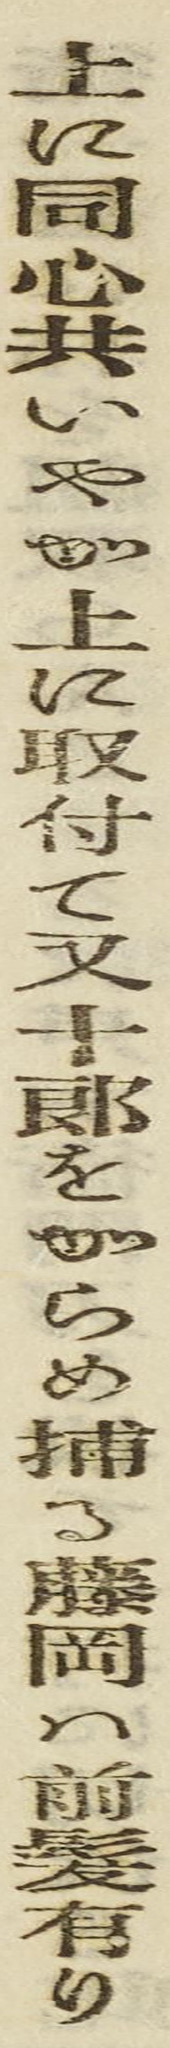上に同心共いやか上に取付て又十郎をからめ捕る藤岡は前髪有り
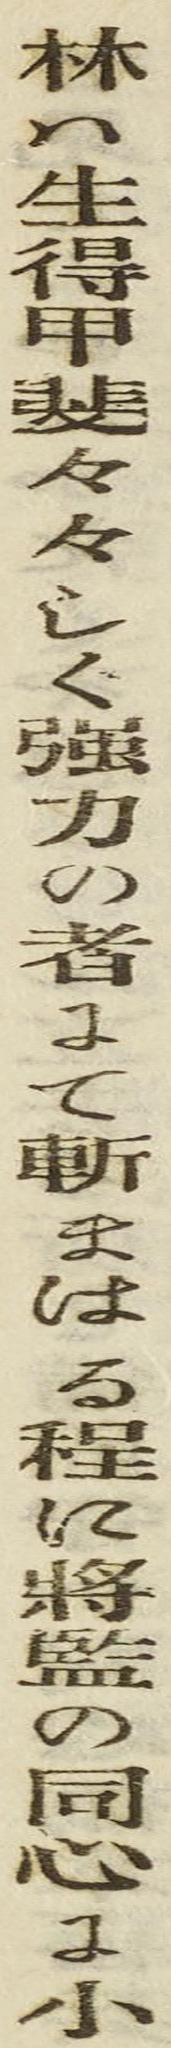林は生得甲斐々々しく強力の者にて斬まはる程に将監の同心に小
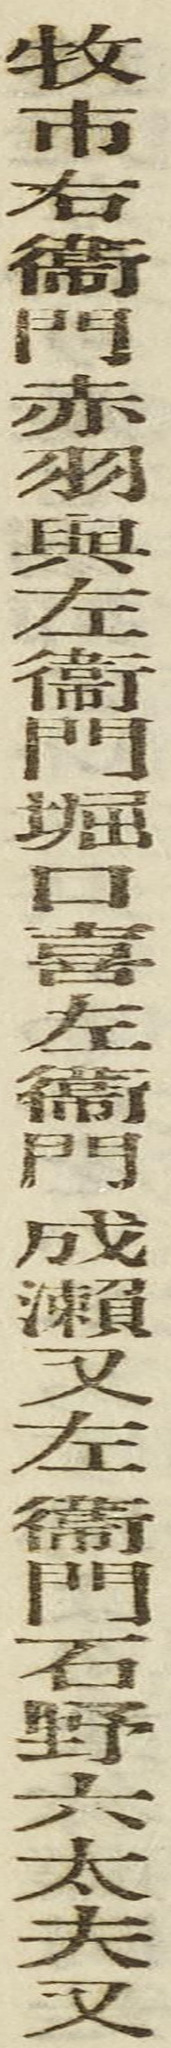牧市右衞門赤羽与左衞門堀口喜左衞門成瀬又左衞門石野六太夫又
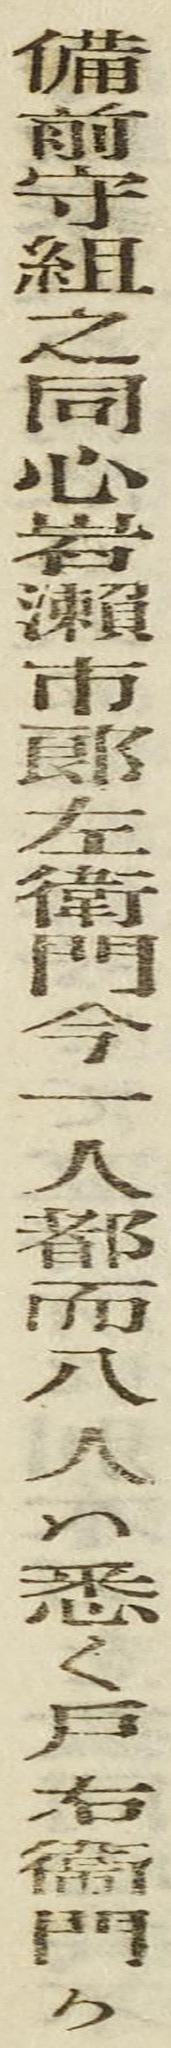備前守組之同心岩瀬市郎左衛門今一人都而八人は悉く戸右衞門か
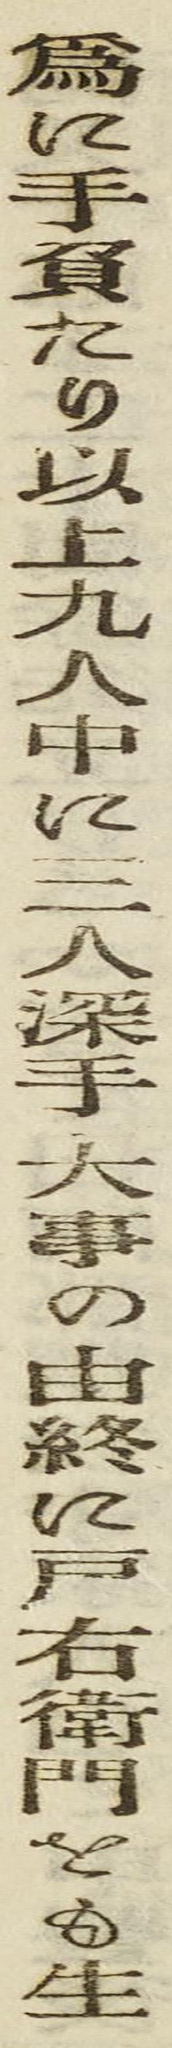為に手負たり以上九人中に三人深手大事の由終に戸右衛門をも生
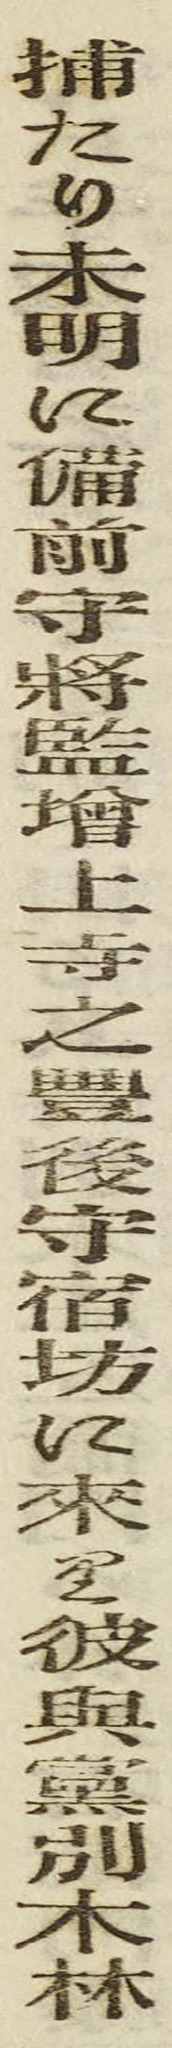捕たり未明に備前守将監増上寺之豊後守宿坊に来り彼与党別木林
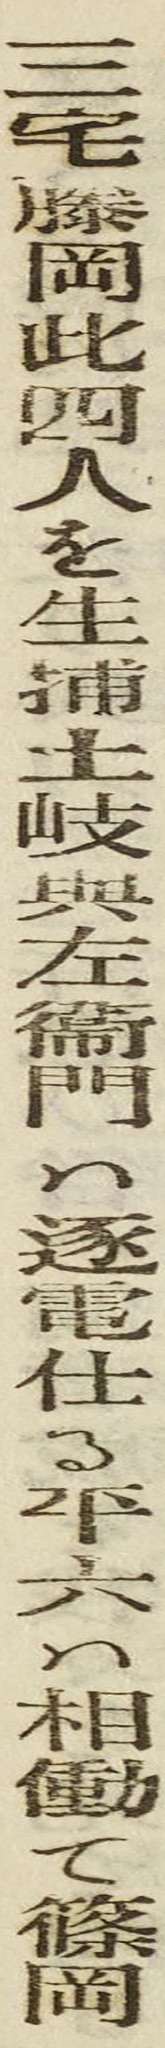三宅藤岡此四人を生捕土岐与左衞門は逐電仕る平六は相働て篠岡
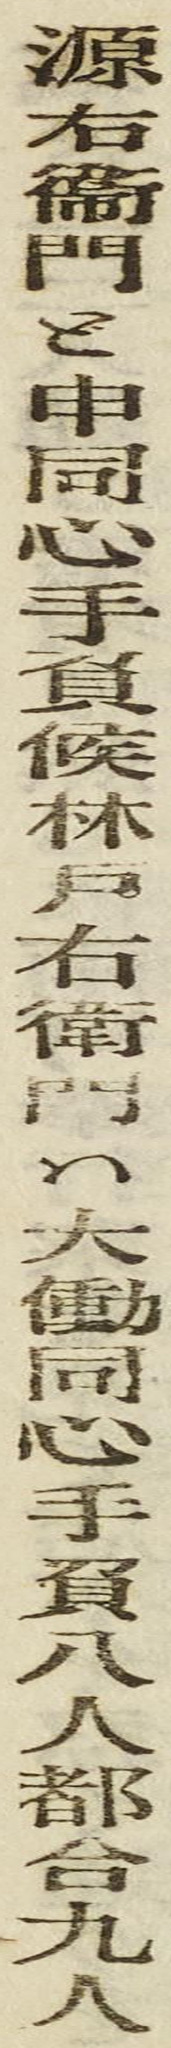源右衞門と申同心手負候林戸右衛門は大働同心手負八人都合九人
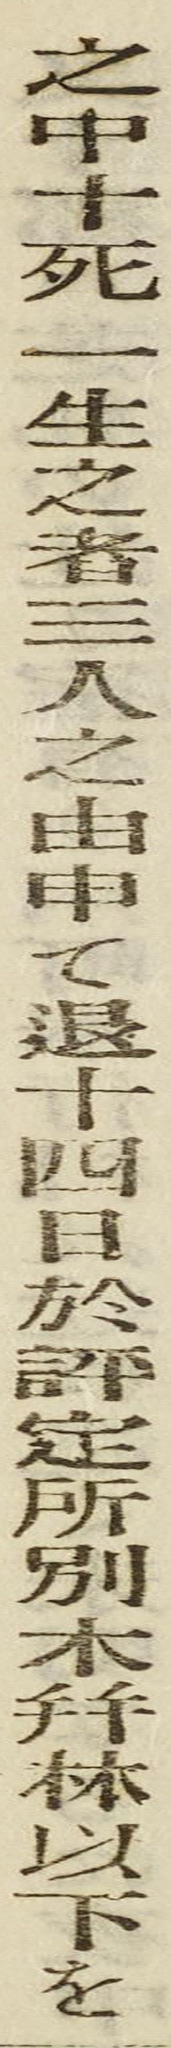之中十死一生之者三人之由申て退十四日於評定所別木幷林以下を
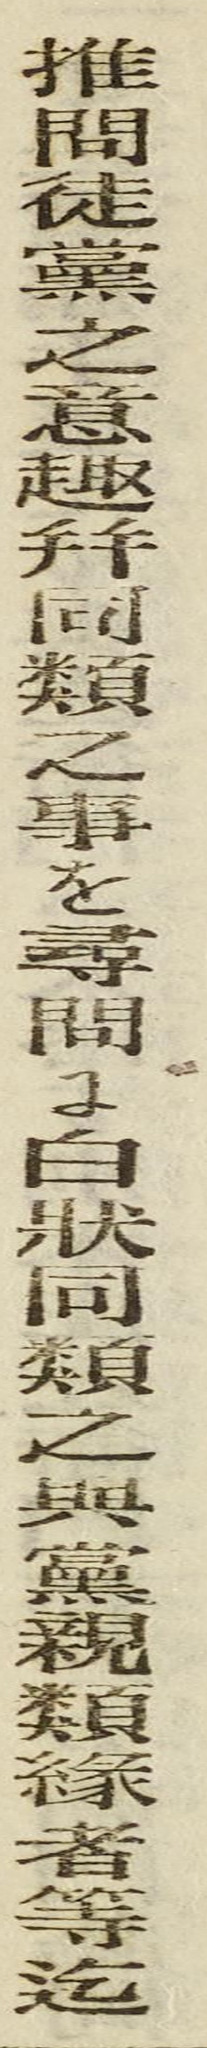推問徒党之意趣幷同類之事を尋問に白状同類之与党親類縁者等迄
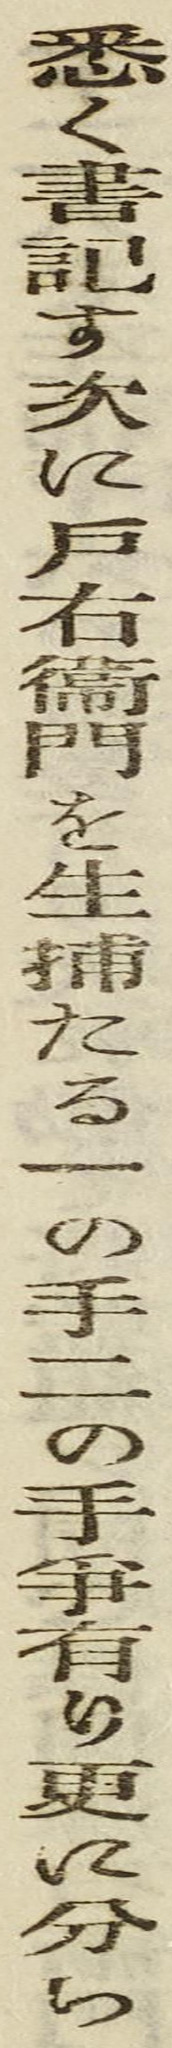悉く書記す次に戸右衞門を生捕たる一の手二の手争有り更に分ら
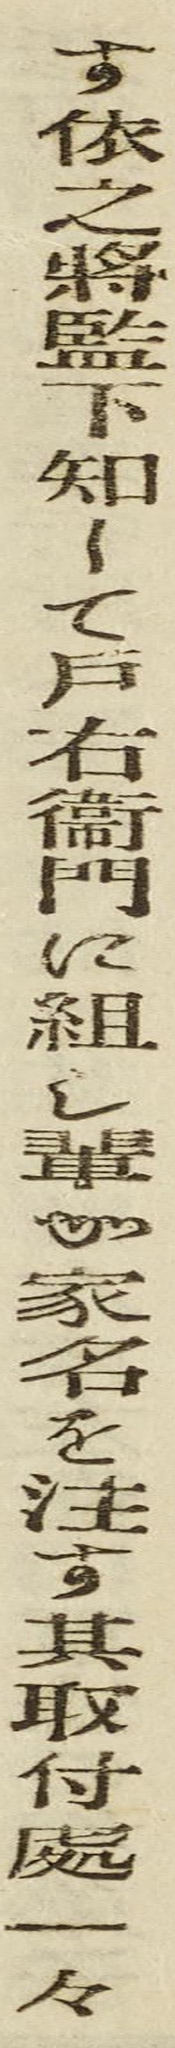す依之将監下知して戸右衞門に組し輩か家名を注す其取付処一々
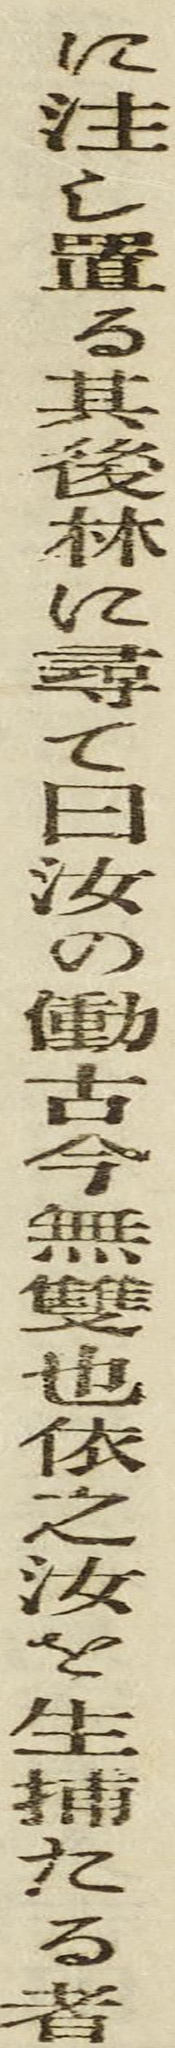に注し置る其後林に尋て曰汝の働古今無双也依之汝を生捕たる者
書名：史籍集覽　朝鮮陣古文・細井廣澤記・颶風紀事・天明七年將軍宣下次第書　全
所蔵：東京大学地震研究所図書室 Earthquake Research Institute Library, The University of Tokyo, JAPAN
